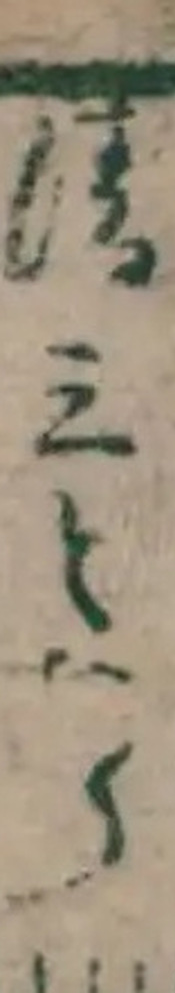清三とあら
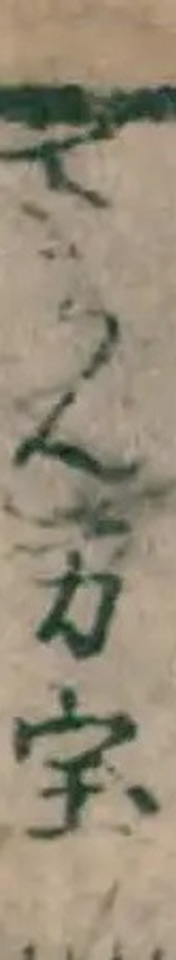七ちん万宝
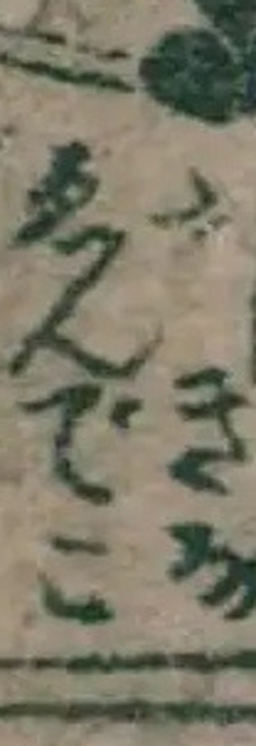ゑんでこ
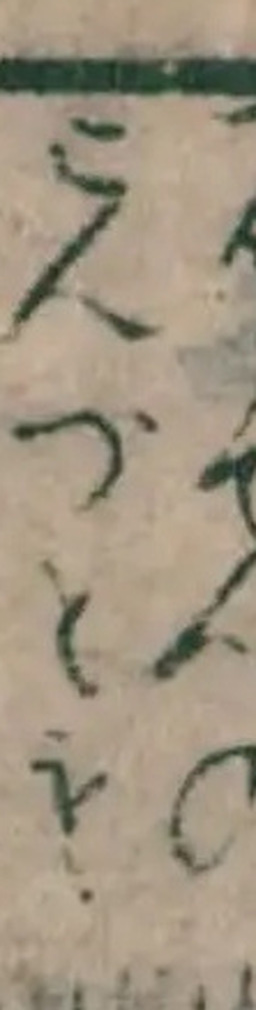こんづとも
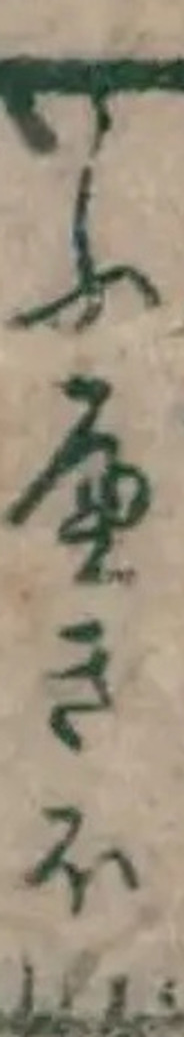いふへきほ
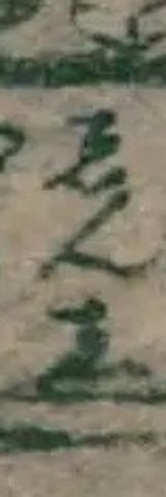しんし
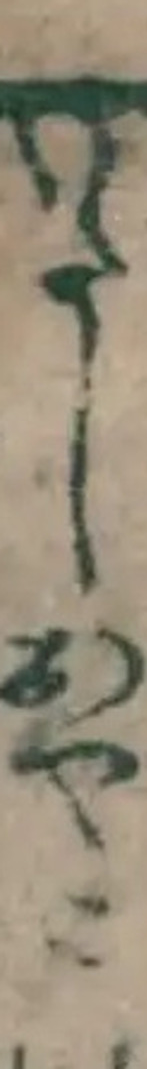いだしおやこ
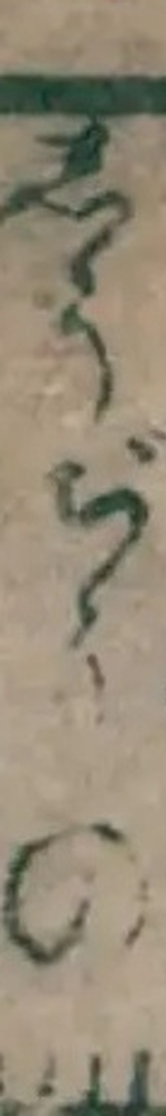しうぢうの
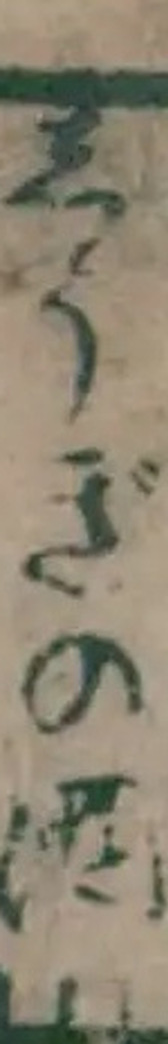しうぎの酒
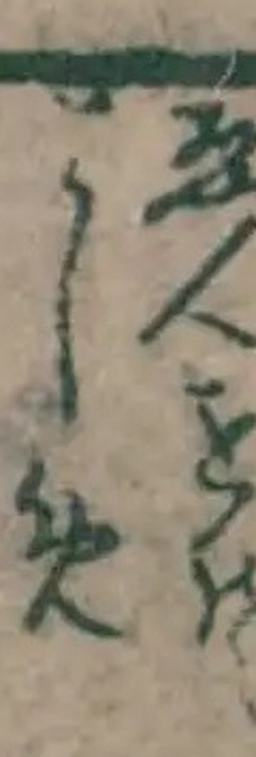はしめ

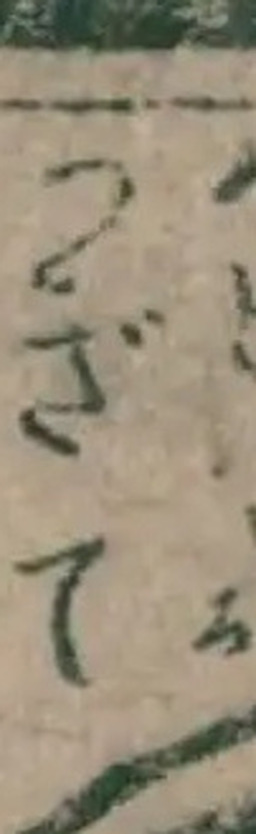つぎて
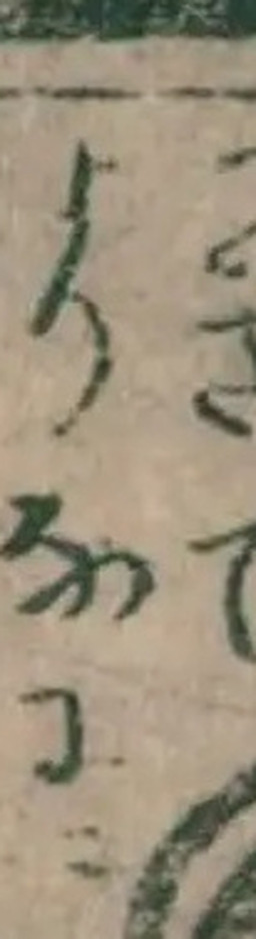よりなに
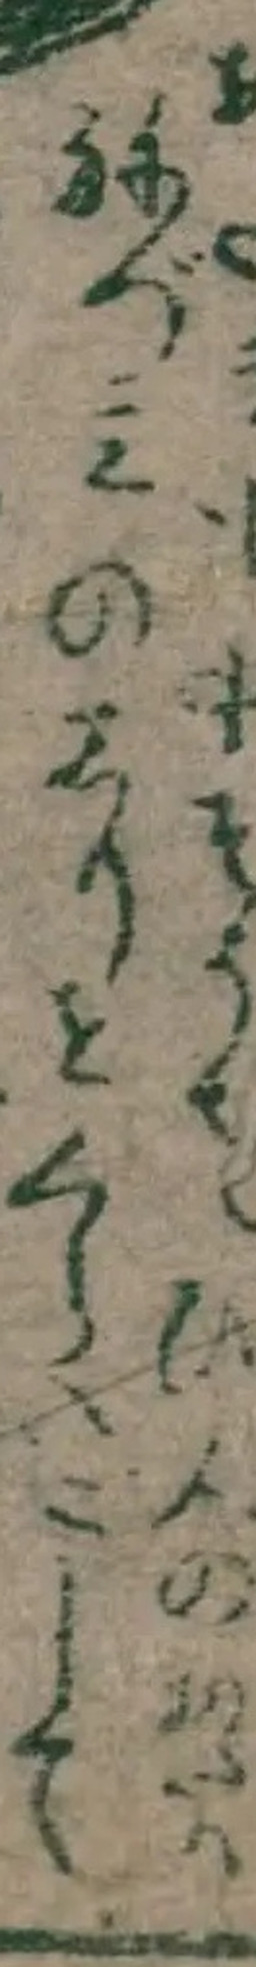ねづみのしりをくらへこして
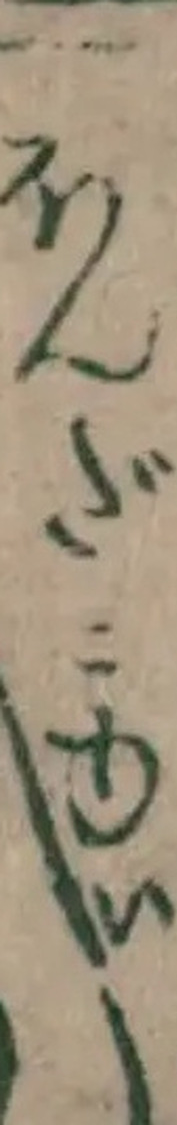ほんだにゆい
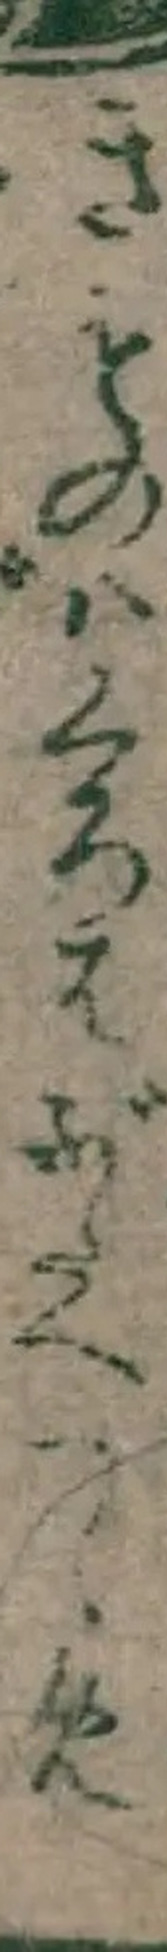きもはくろはぶたへつくめ
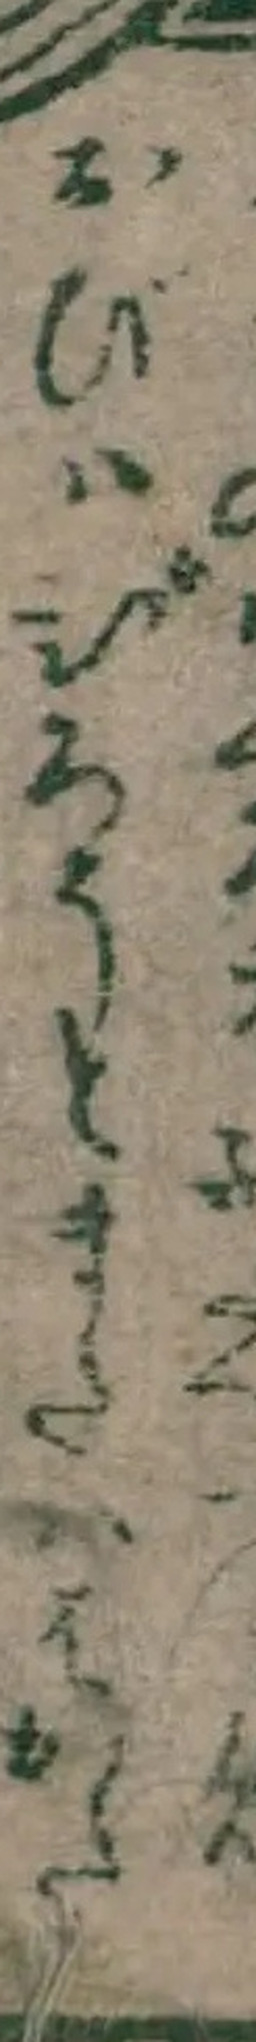おびはびろうとまたははかた
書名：金々先生栄花夢 : 2巻
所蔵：国立国会図書館 National Diet Library, JAPAN
